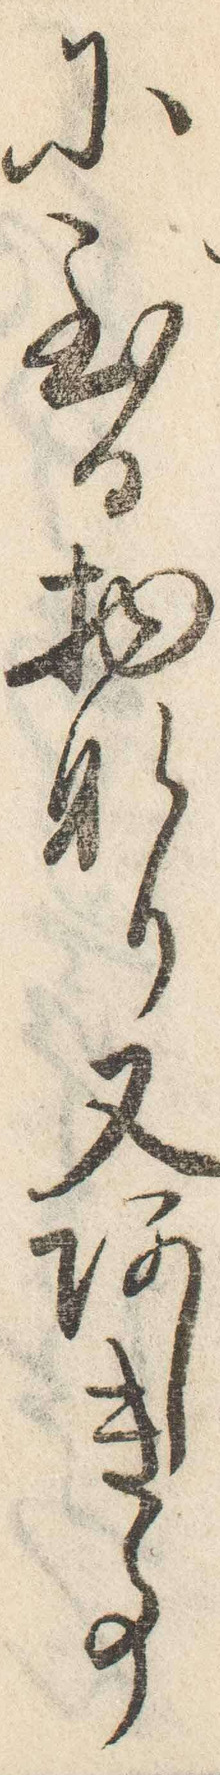に至る物なり又あしき事
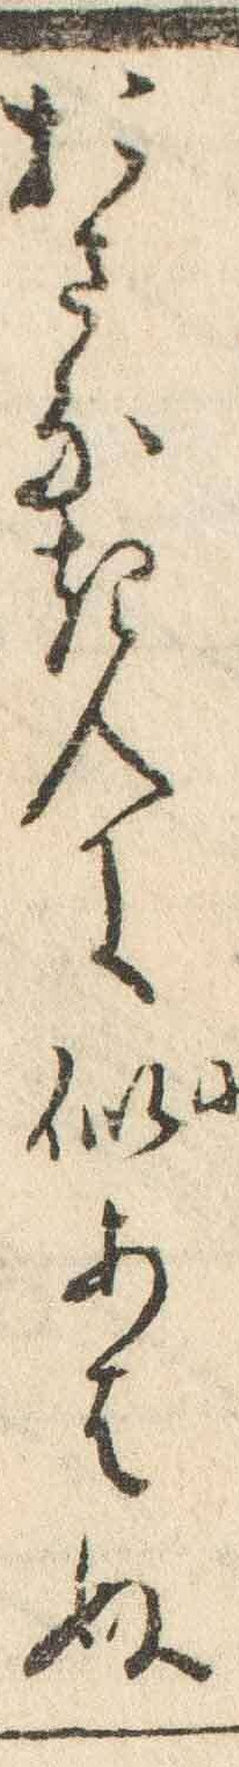おさなき人に似あはぬ
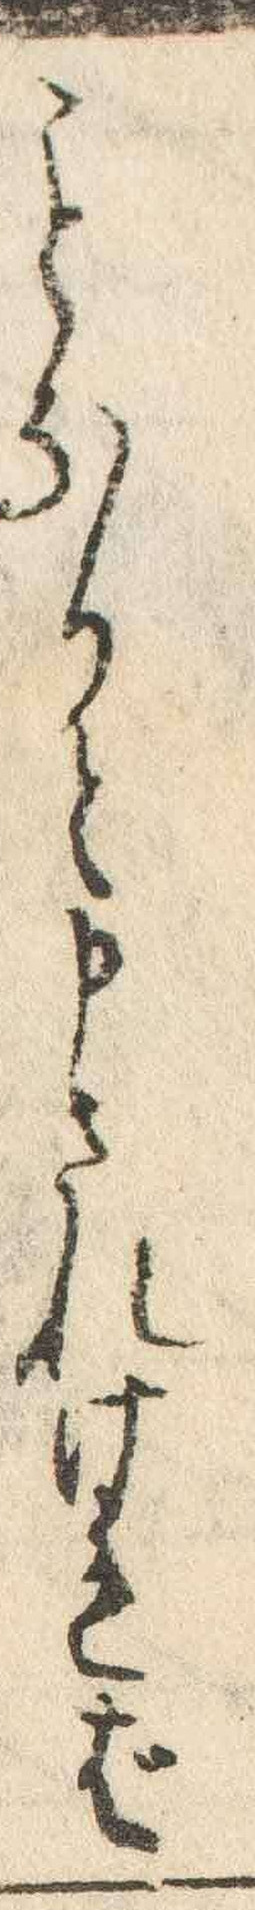ことなりと申されければ
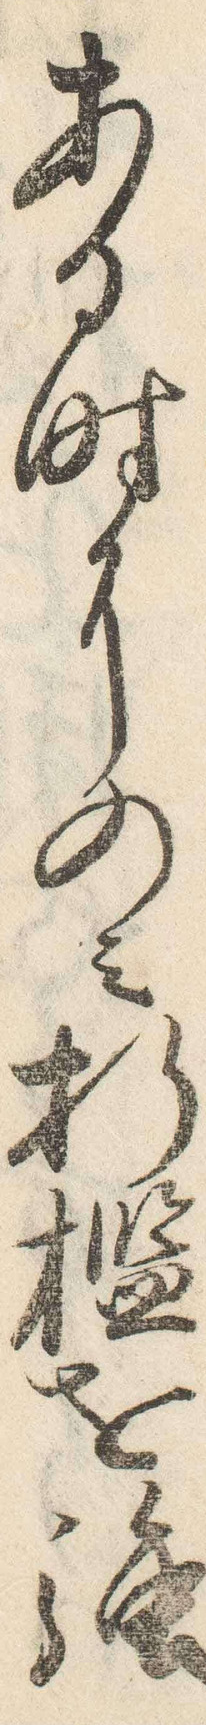ある時にのみ折檻を強
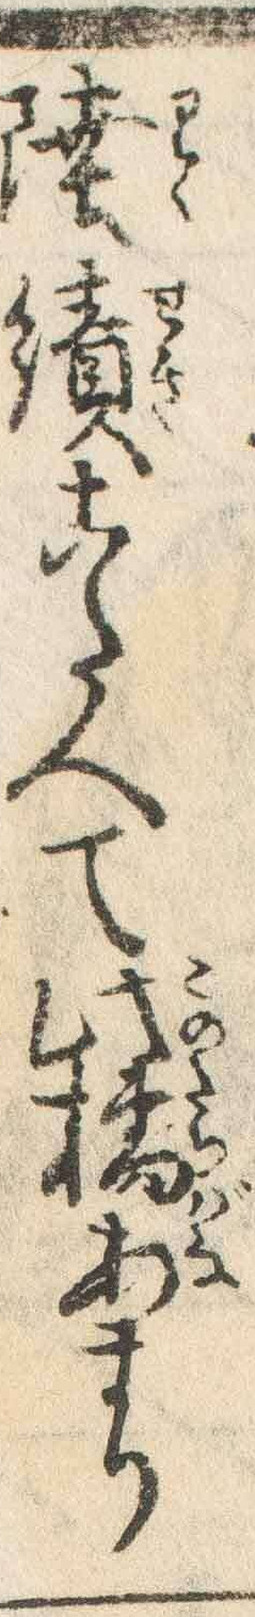陸績こたへて此橘あまり
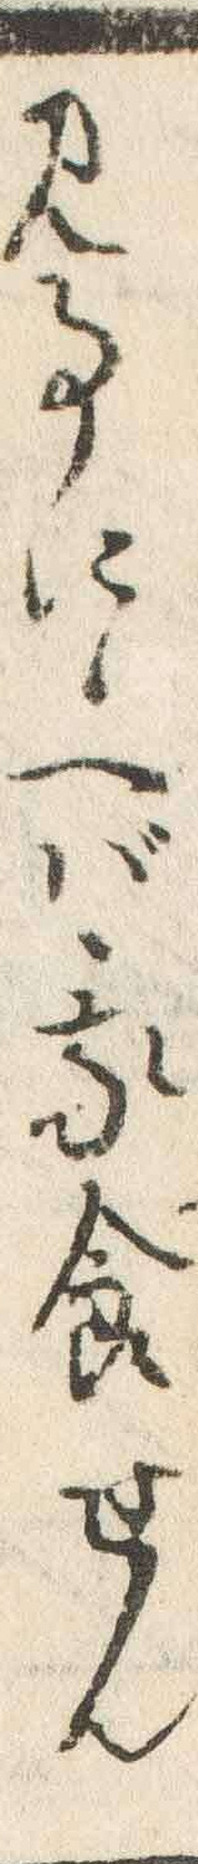見事に候へば我食せん
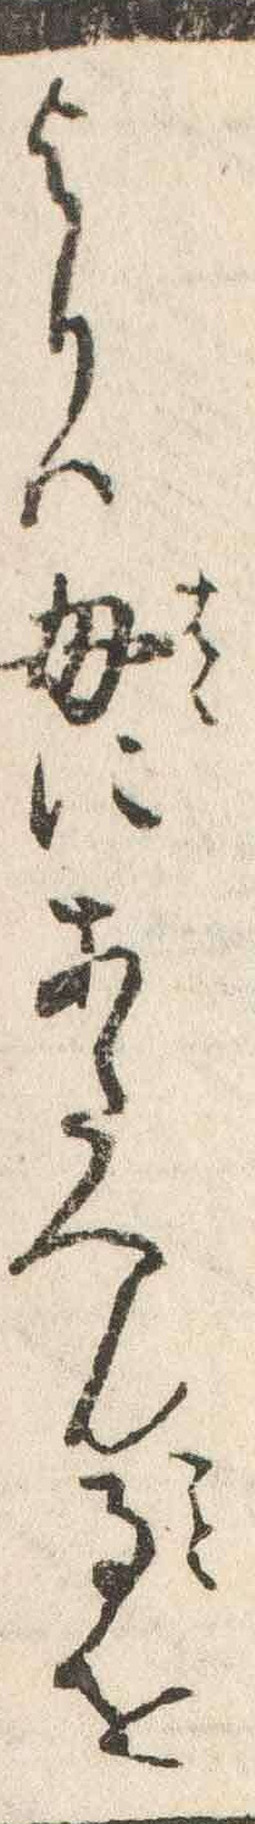よりは母にあたへん事を
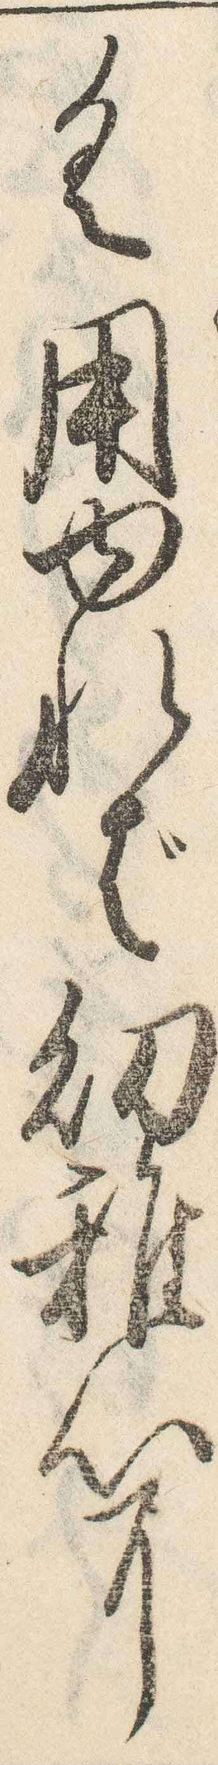く用ゆれば幼稚心に
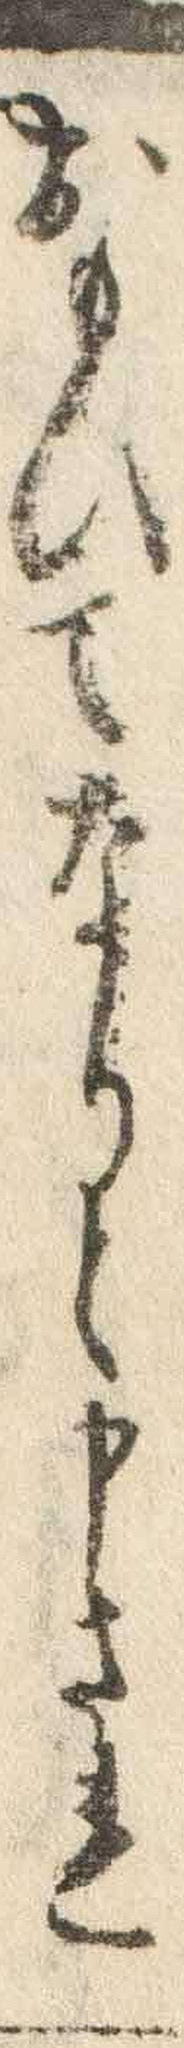おもひてなりと申され
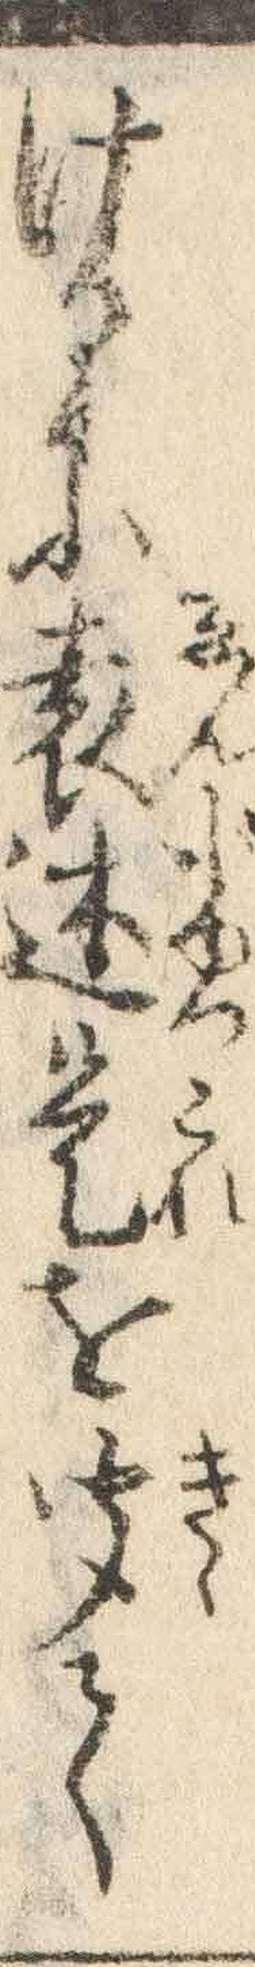けるに袁述是を聞て
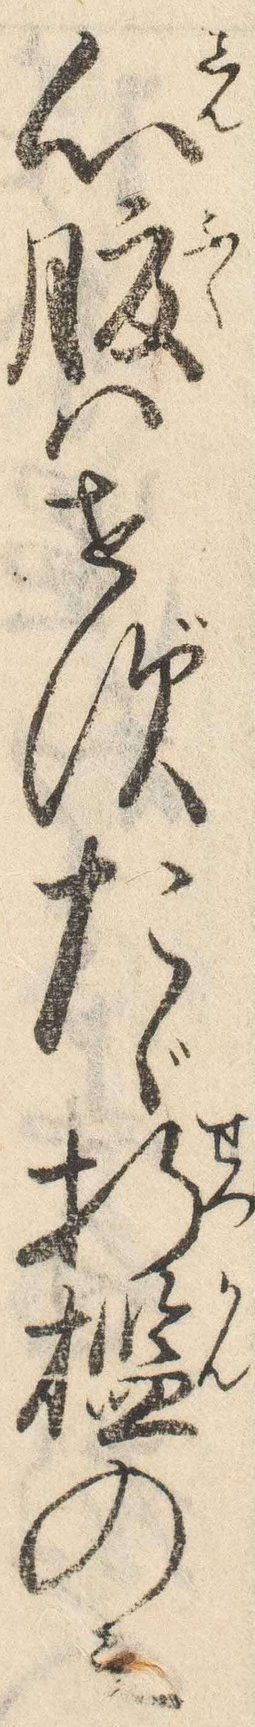心服はせずたゞ折檻のみ
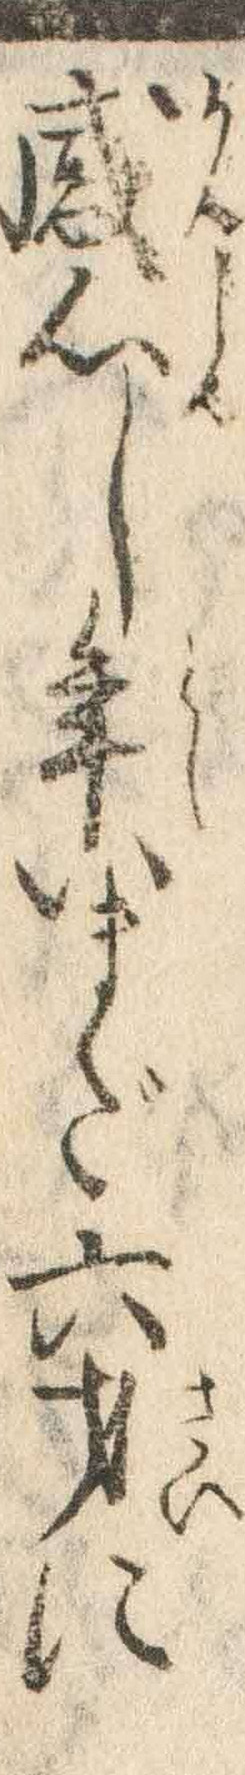感心し年いまだ六才に
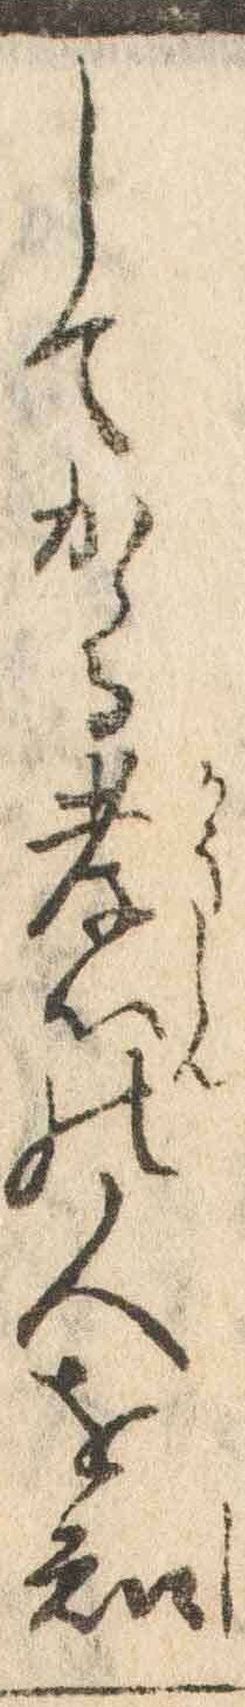してかゝる孝心の人を知
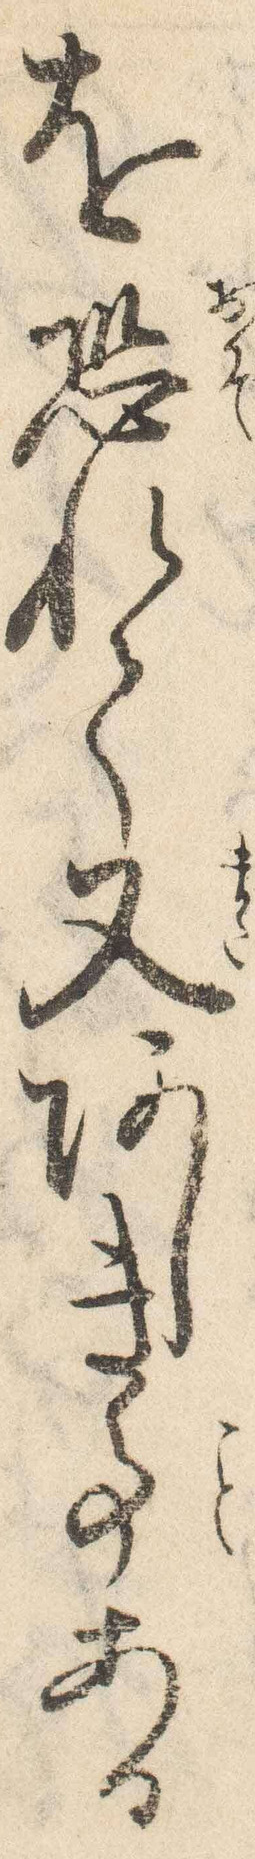を恐れて又あしき事ある
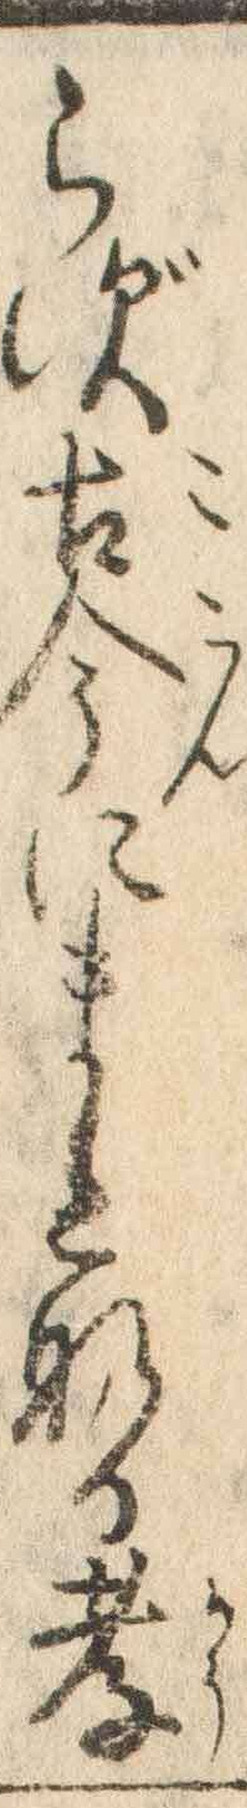らず古今にまれなる孝
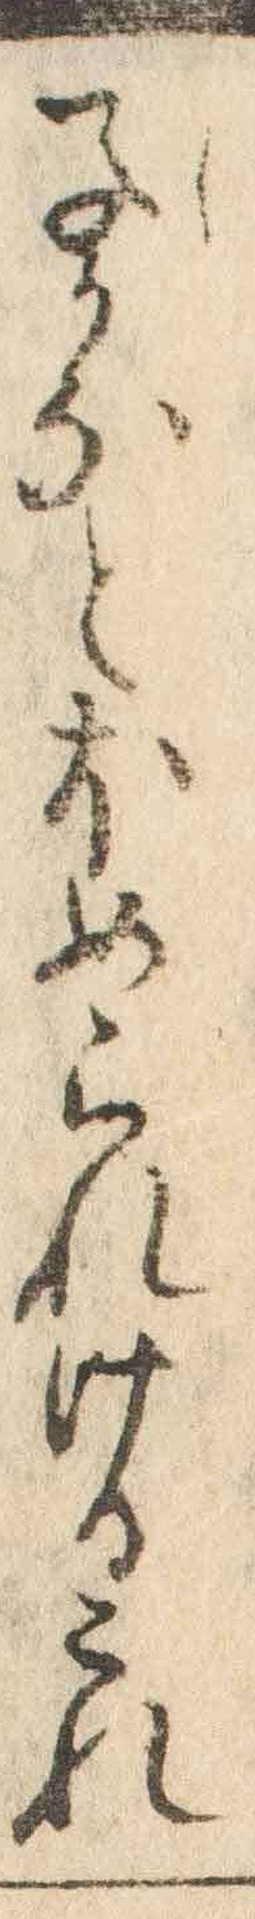子かなとほめられけるこれ
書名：撫育草
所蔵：東京学芸大学附属図書館 国文学研究資料館
